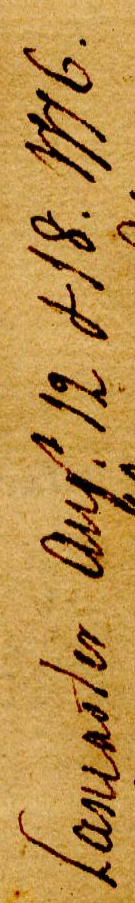Lancaster Aug^t. 12 & 18. 1776.
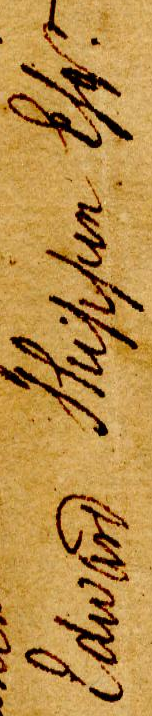Edward Shippen Esq^r.
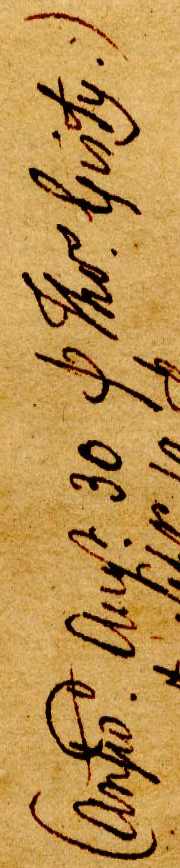(Answ^d. Aug^t. 30 per Tho^s. Girty.)
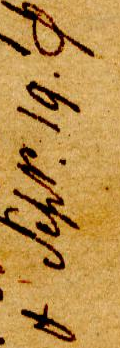& Sept^r. 19. per
